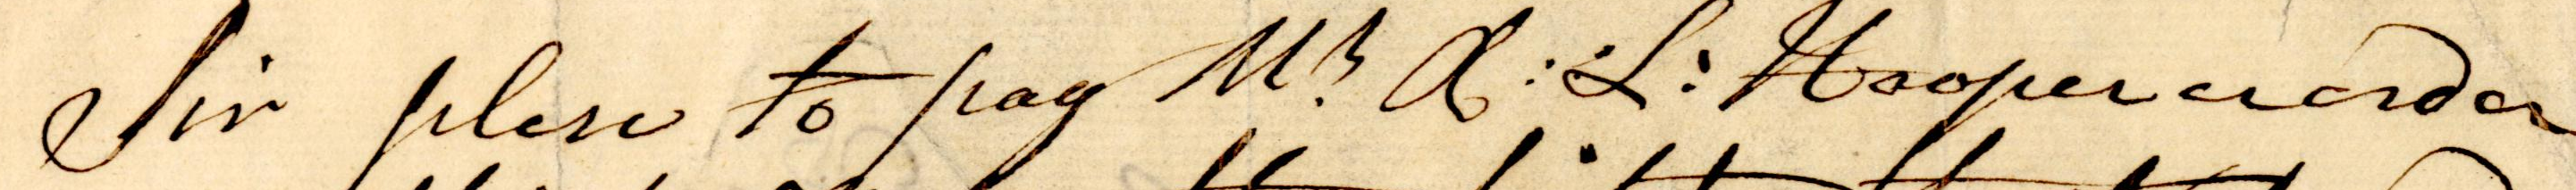Sir plese to pay M^r. G. L: Hooper an order
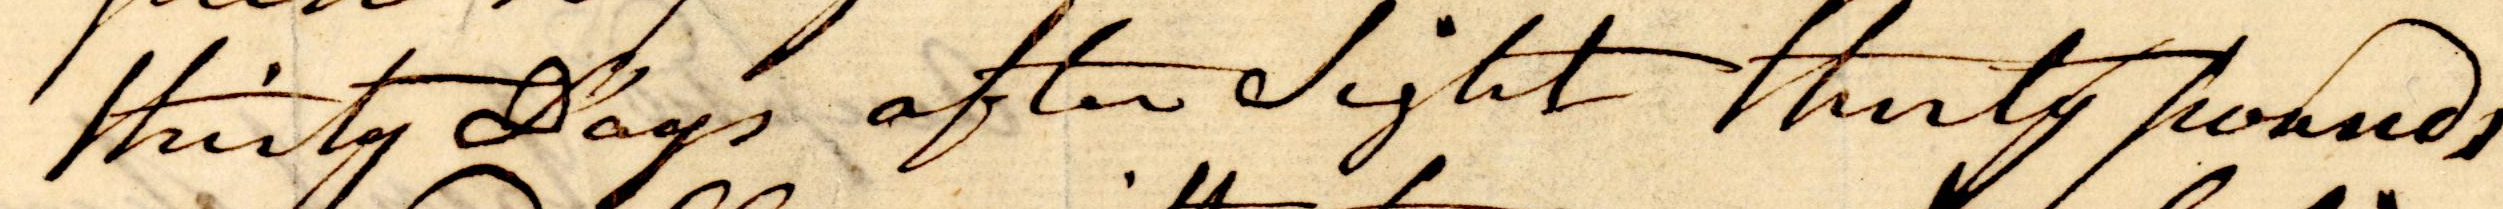thirty days after sight thirty pounds
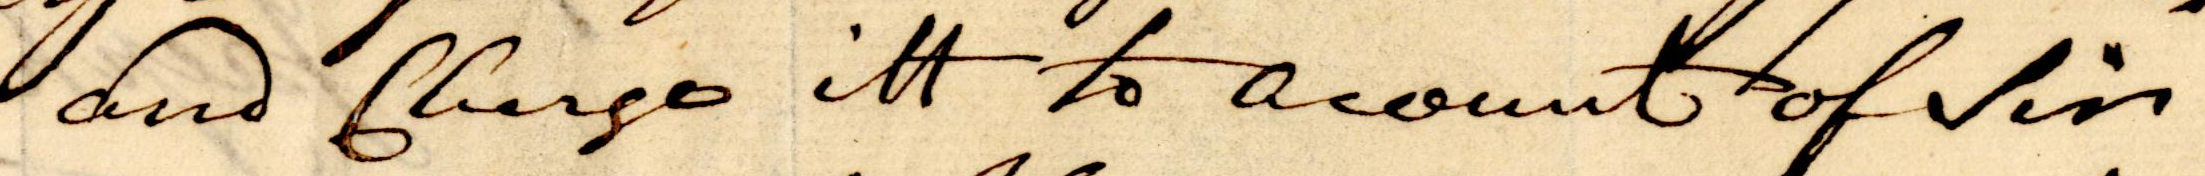and Charge it to account of Sir
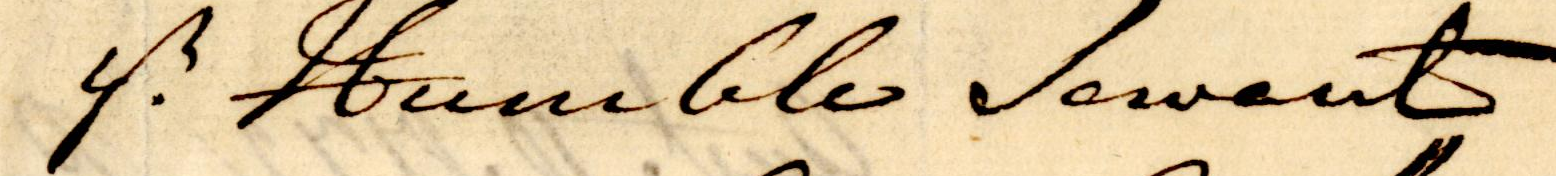y^e humble Servent
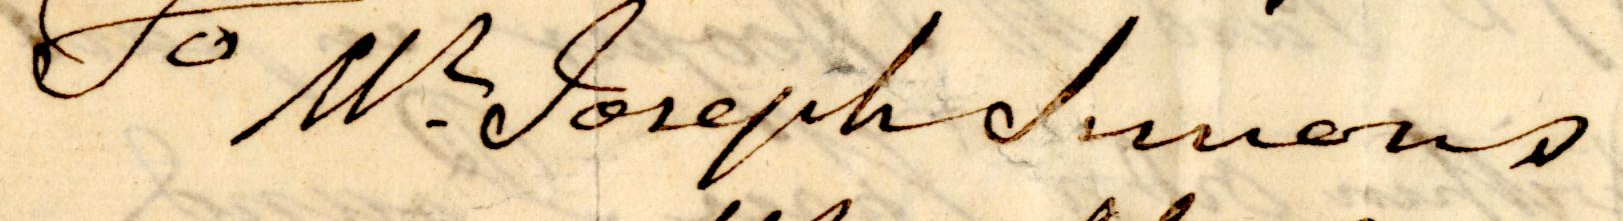To M^r. Joseph Servens
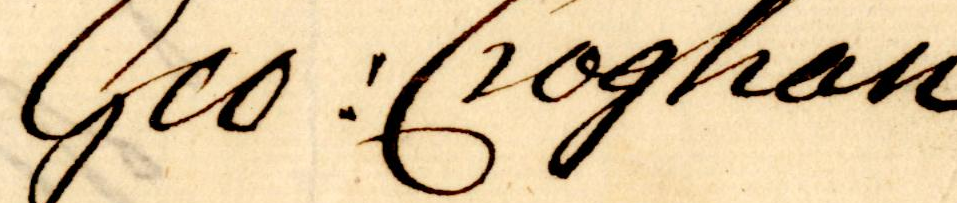Geo Croghan
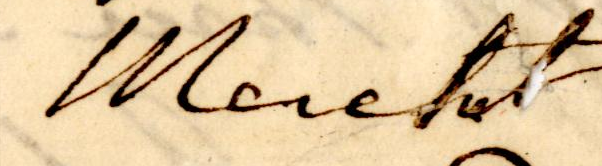Merch^t
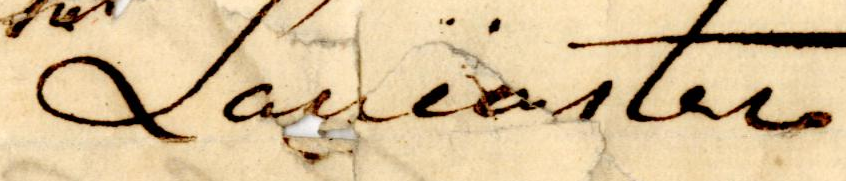Lancaster
